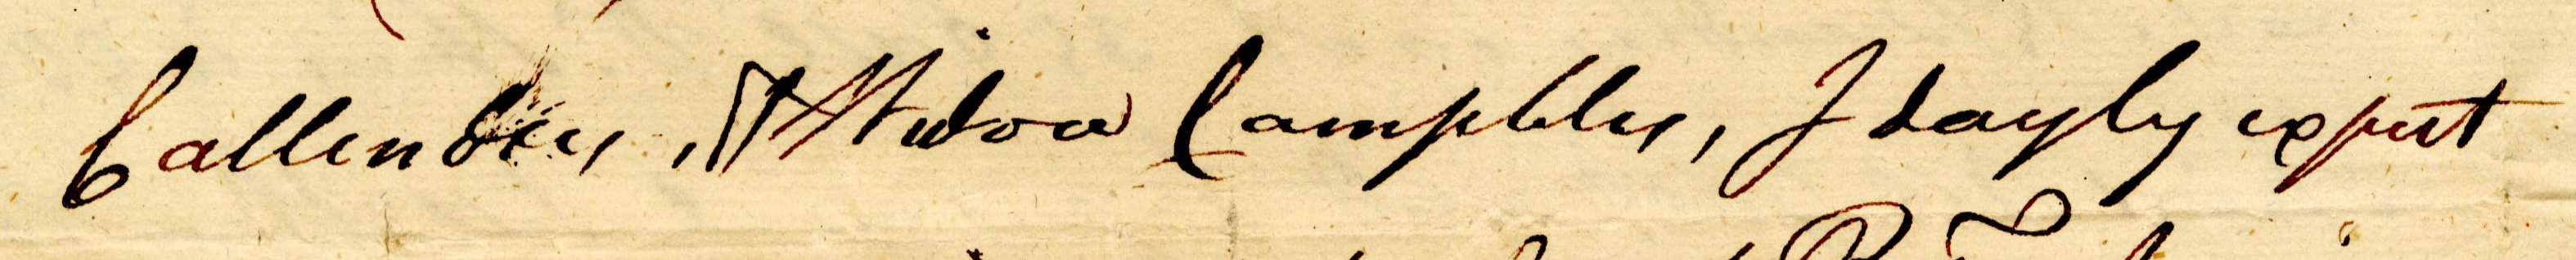Callenders & Widow Campbles, I dayly expect
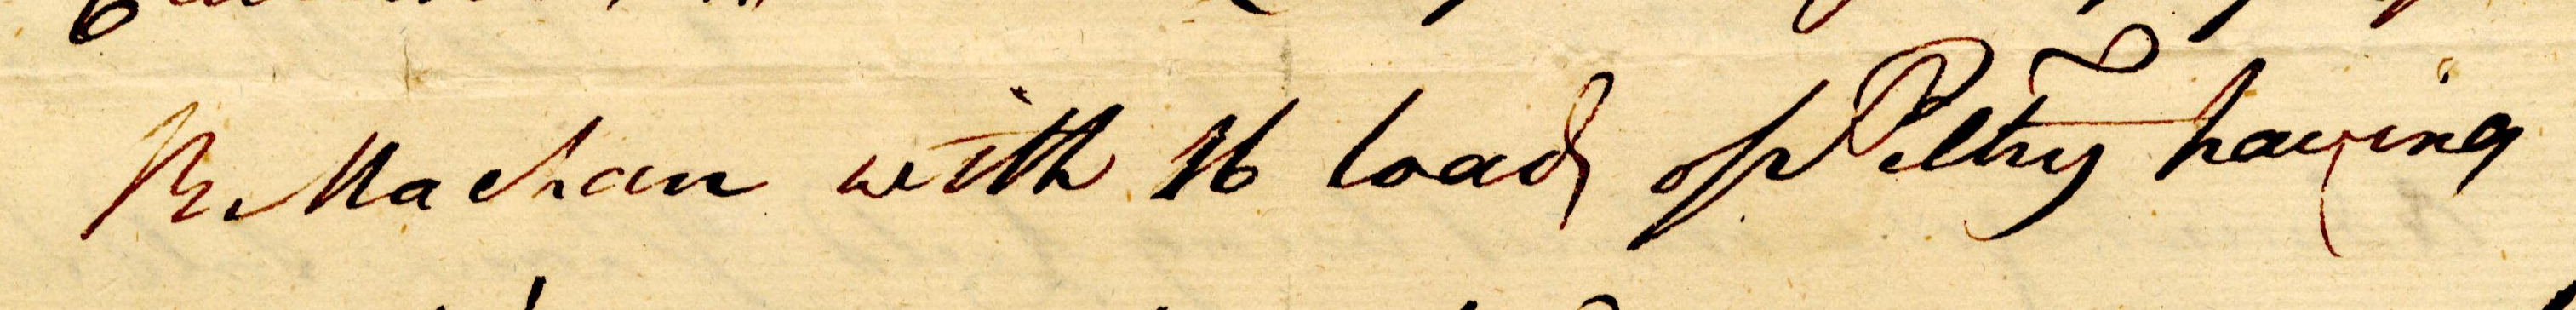R. Machan with 16 loads on Peltry having
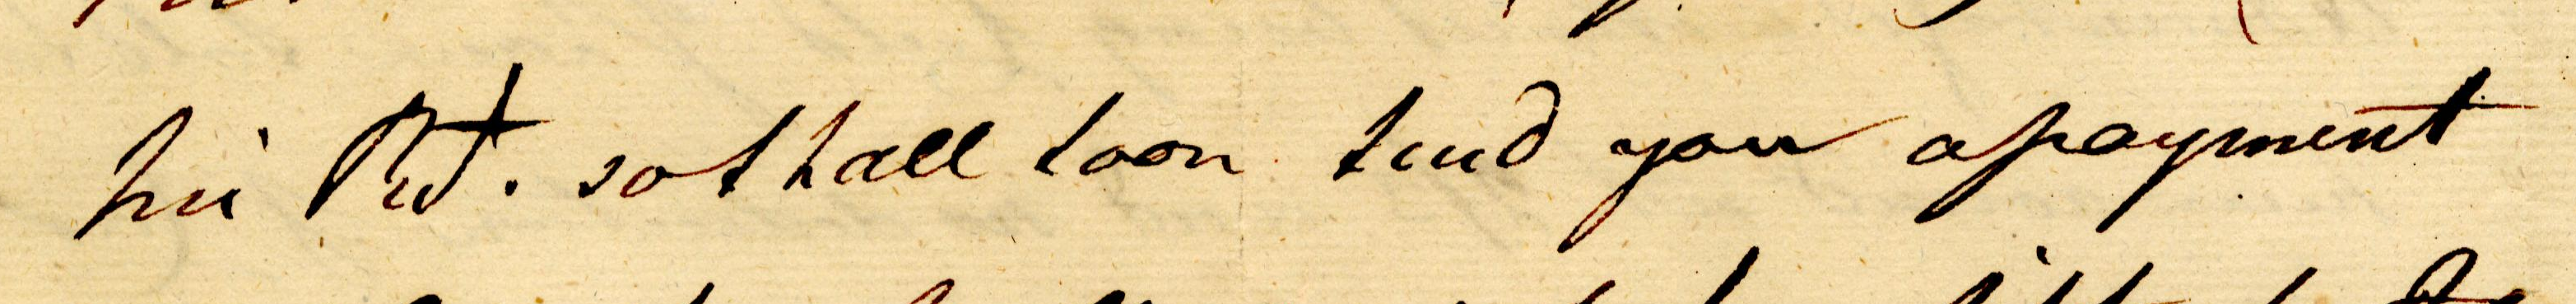his Re^t. so shall soon send you a payment
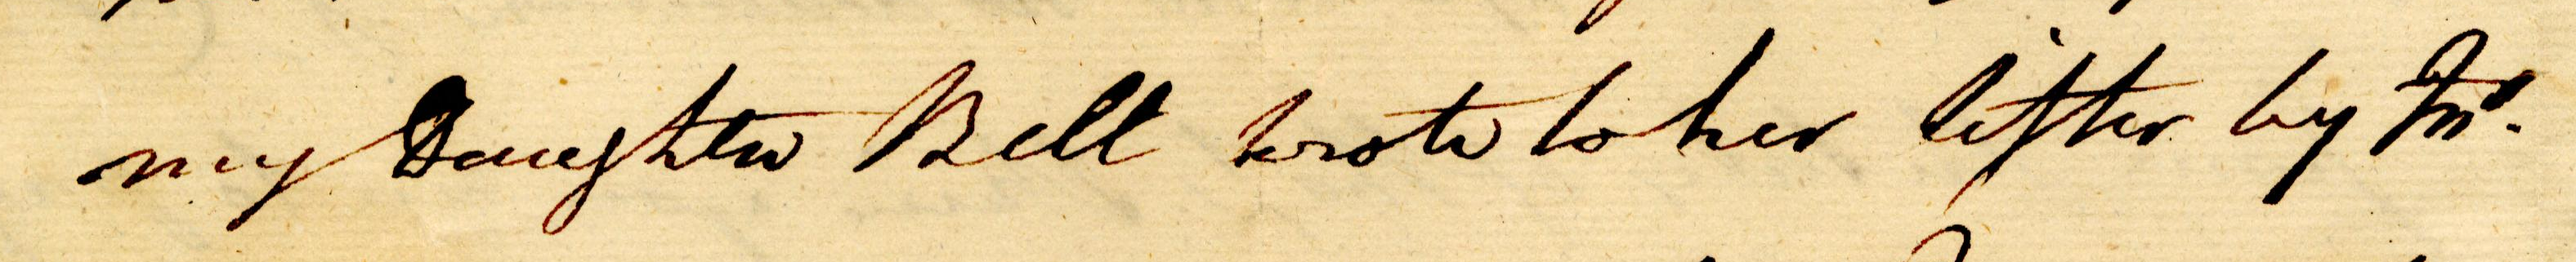my Daughter Bell wrote Sister by M^r
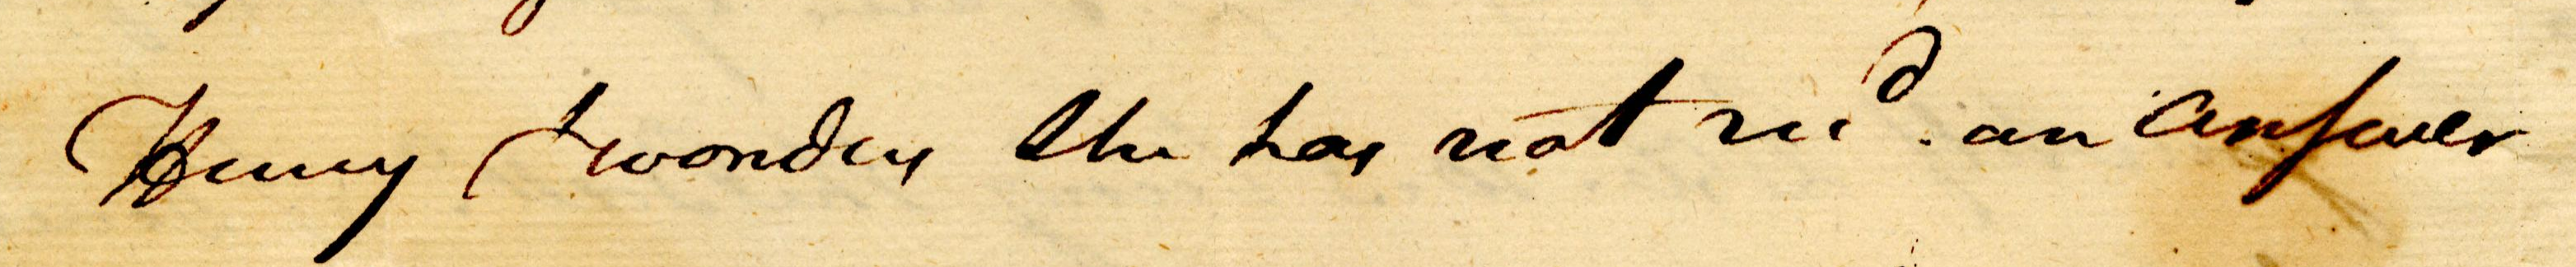Henry & wonder she has not rec^d. an Answer
